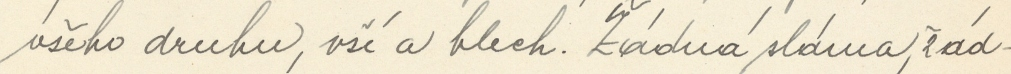všeho druhu, vší a blech. Žádná sláma, žád-
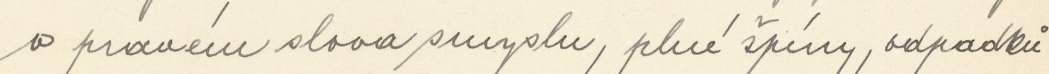v pravém slova smyslu, plné špíny, odpadků
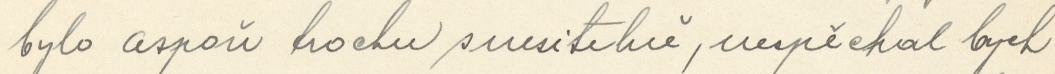bylo aspoň trochu snesitelně, nespěchal bych
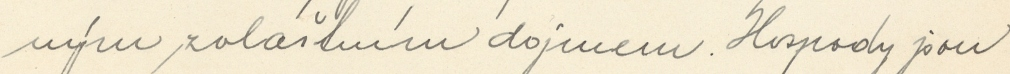ným zvláštním dojmem. Hospody jsou
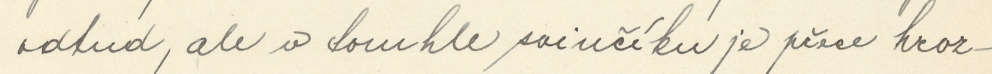odtud, ale v tomhle svinčíku je přece hroz-
